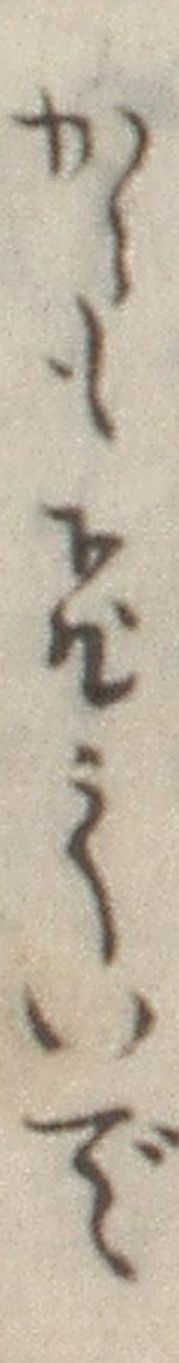からも飛ていで
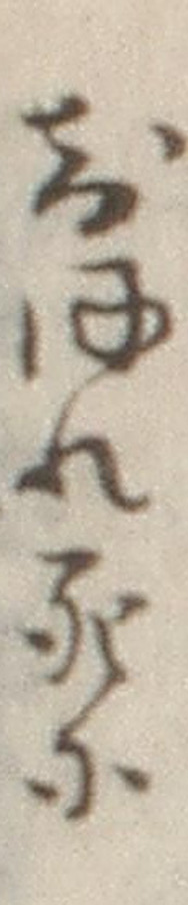おほれ死に
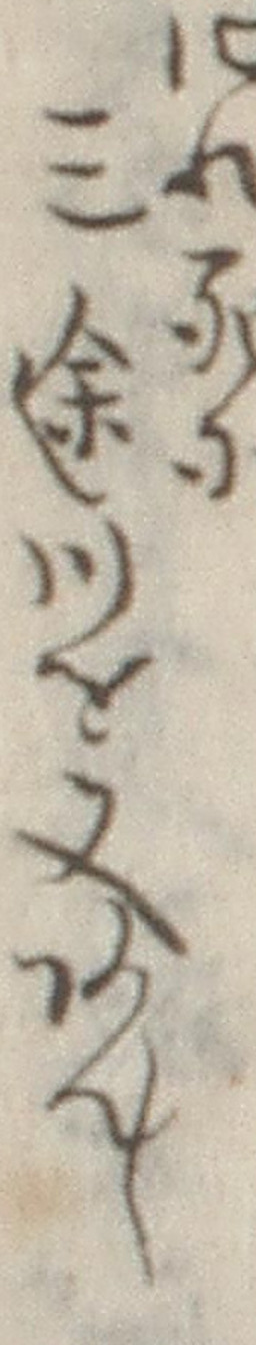三途川を又あんし
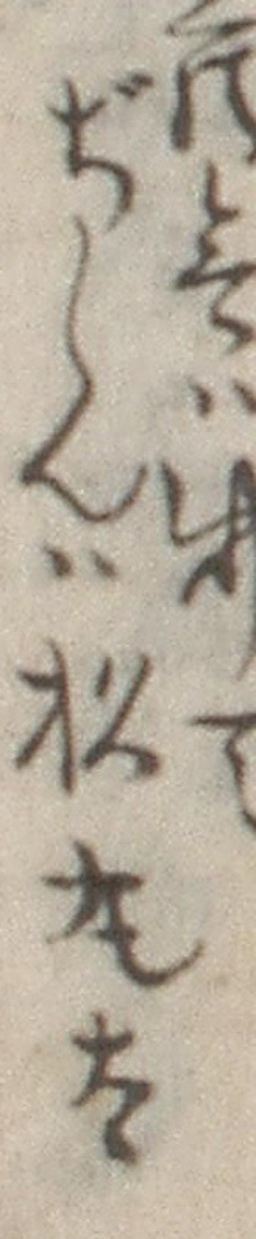ぢしんは松丸太
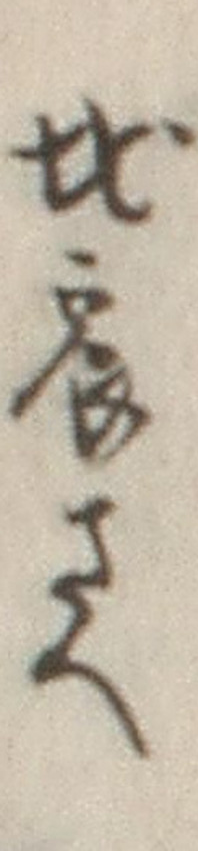地震さへ
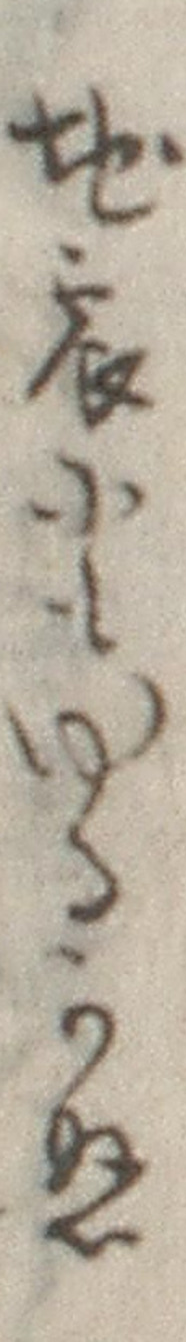地震にもゆるかぬ
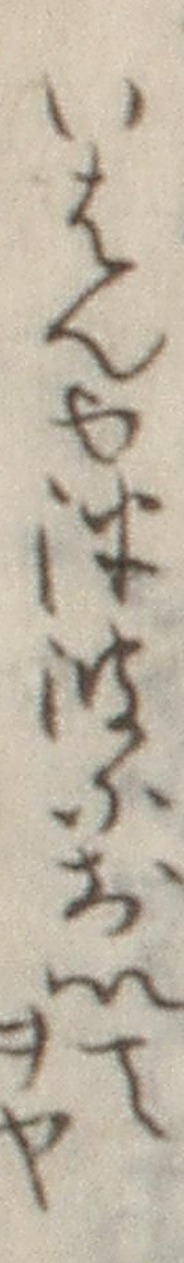いはんや津波においてヲヤ
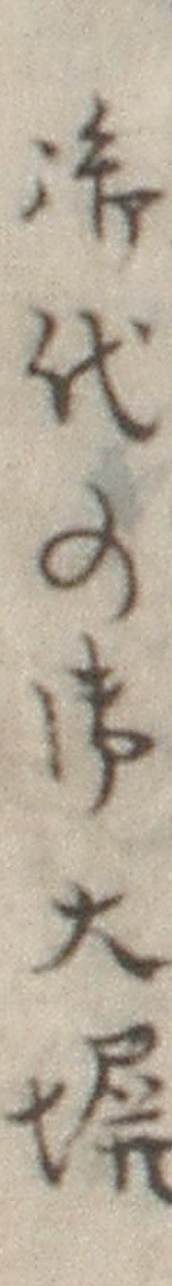御代の御大塀

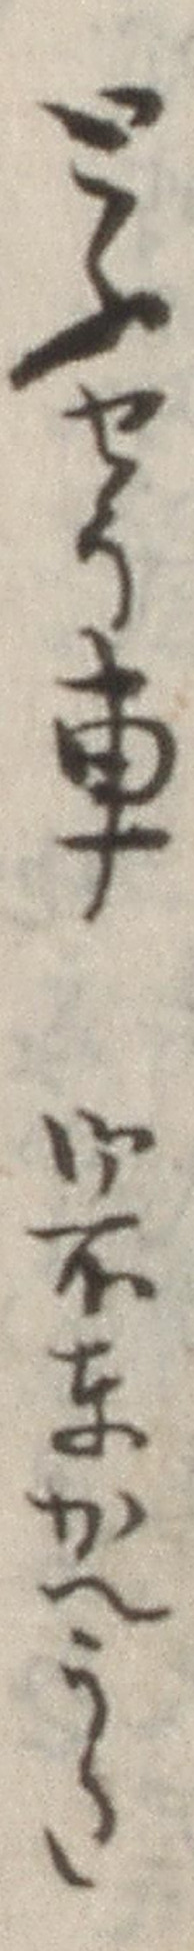どふせう車御所車かへうた
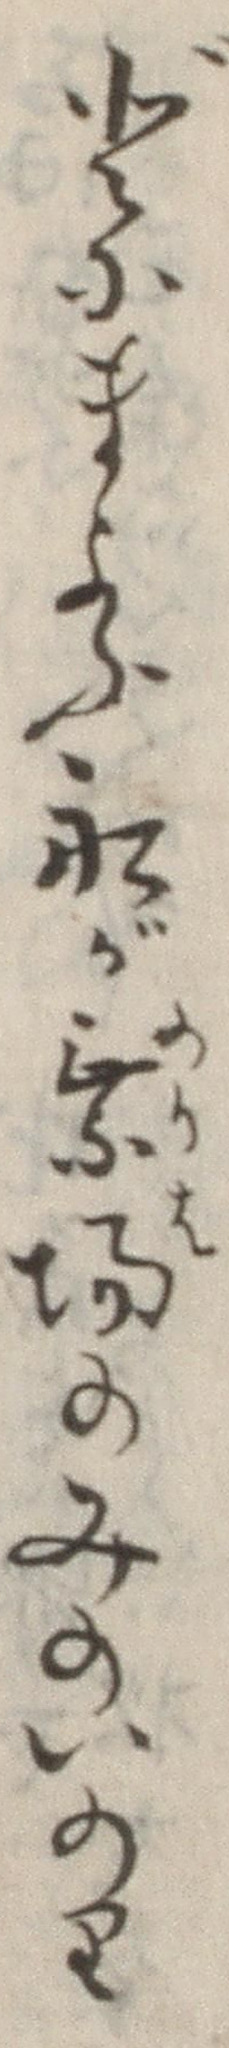どにまよふ舩が乗場のみのいのり
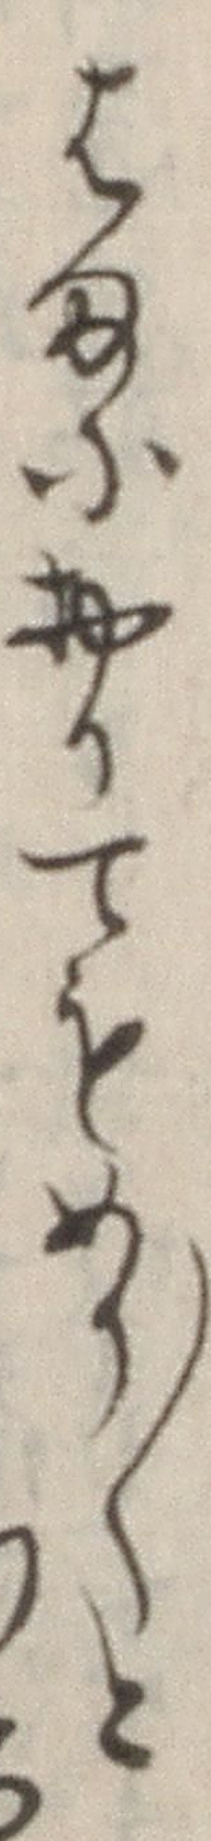はまにおりてもめり〳〵と
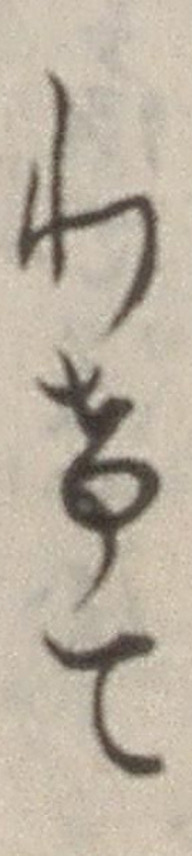わけて
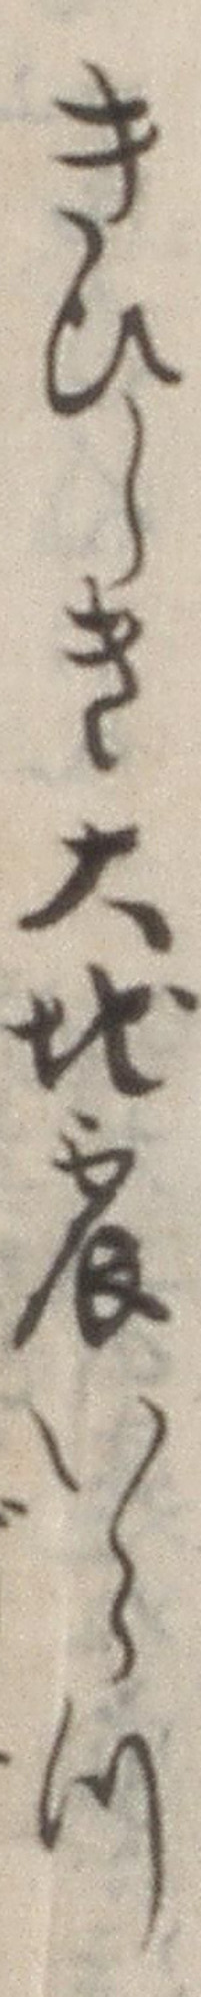きびしき大地震いらつ
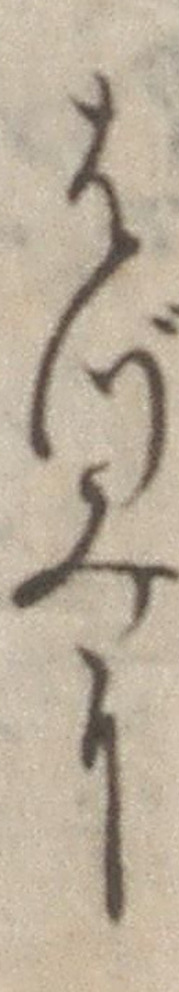はづみに
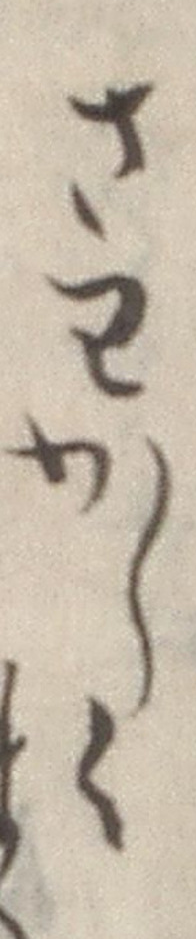さわかしく
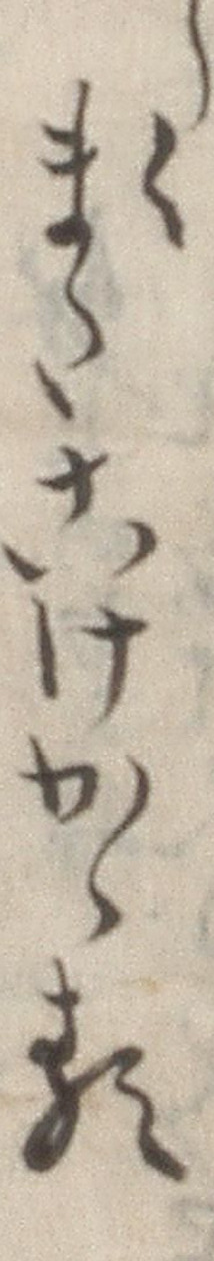またこけかゝる
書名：諸國大地震年代記末代噺種
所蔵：東京大学地震研究所図書室 Earthquake Research Institute Library, The University of Tokyo, JAPAN
